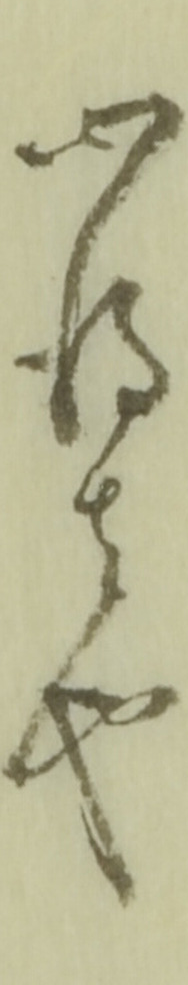心得者也
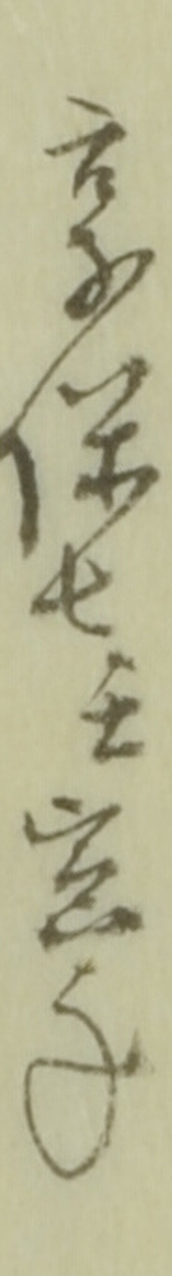享保七壬寅
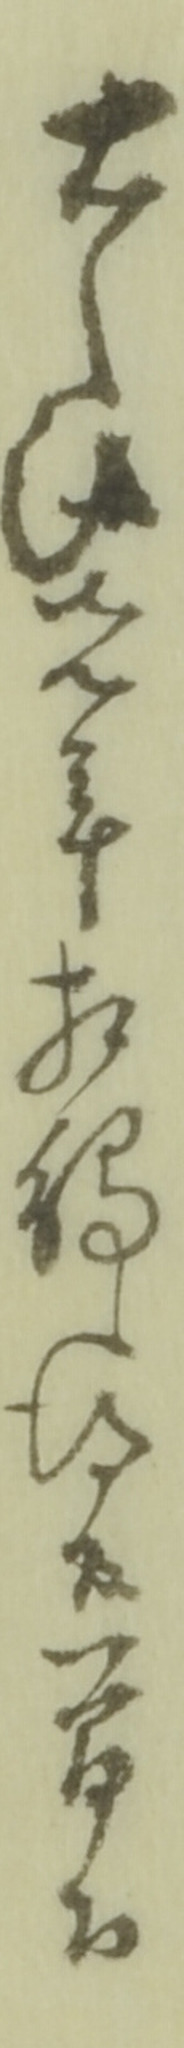右之趣先年相触候得共曽而
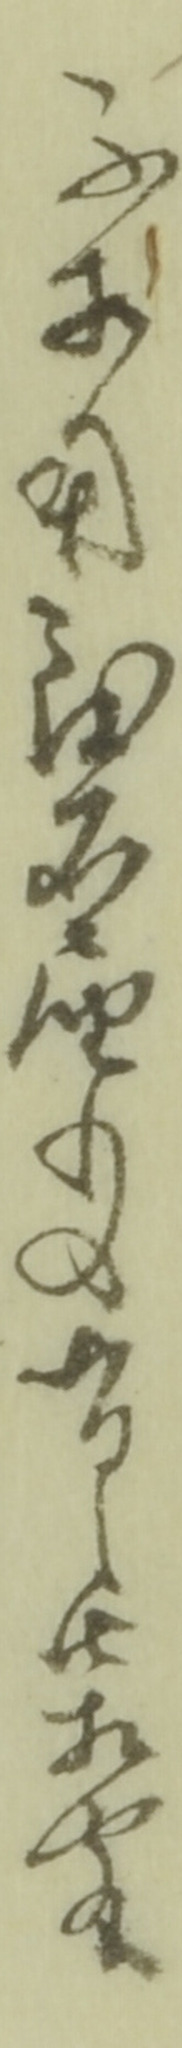不相用致不届もの有之由相聞候
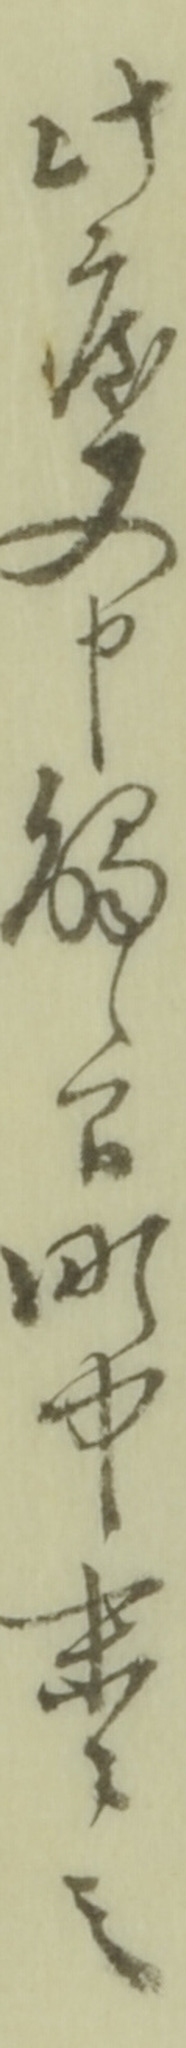此度又申触候間町中末々之
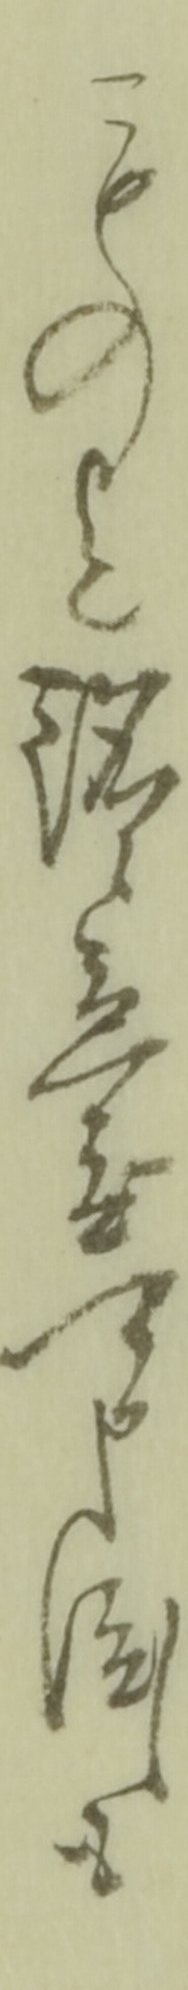もの迄銘々急度可申渡候以上
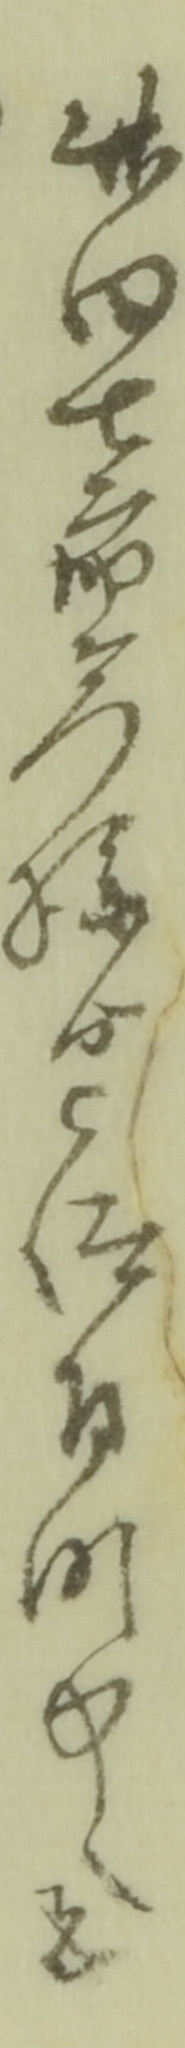竹田七郎右衛門様ゟ被仰付町中へ者
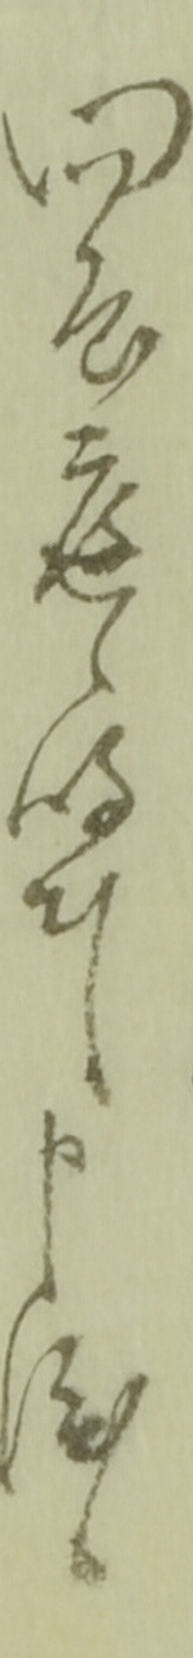問屋庭へ呼出し申渡候

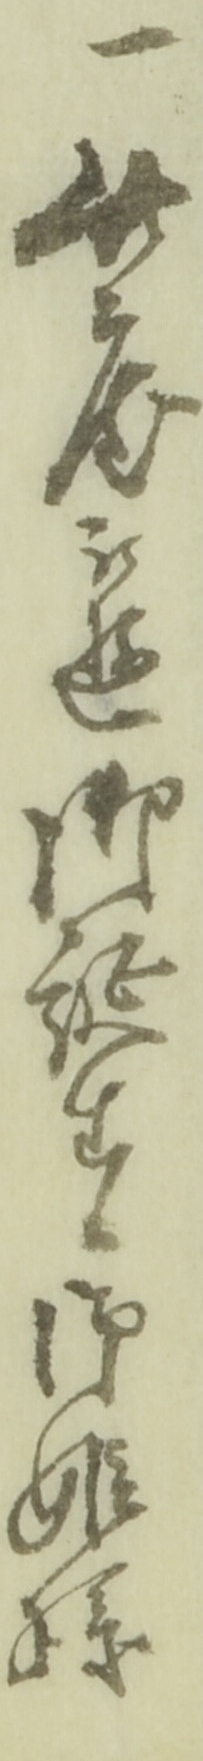一此度被遊御誕生候御姫様
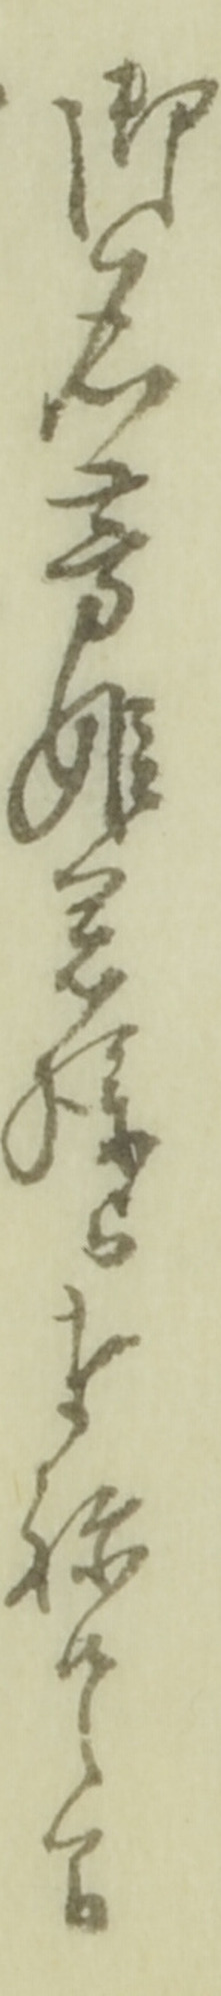御名芳姫君様与奉称候之間
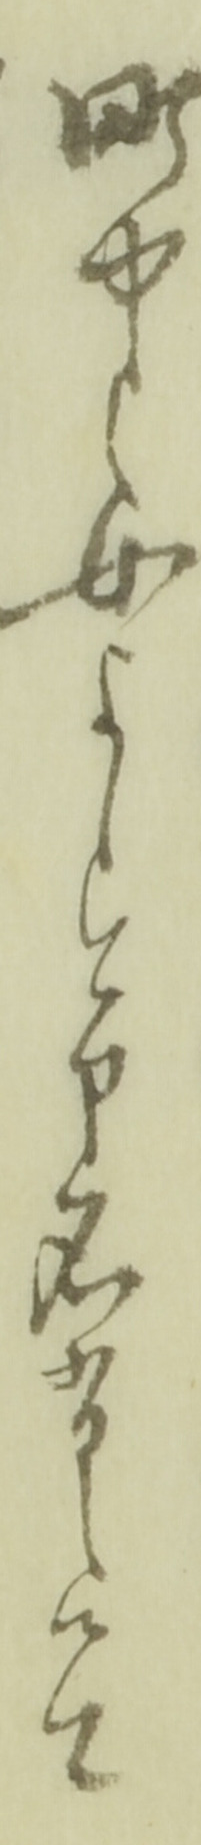町中之女よしと申名有之候ハヽ
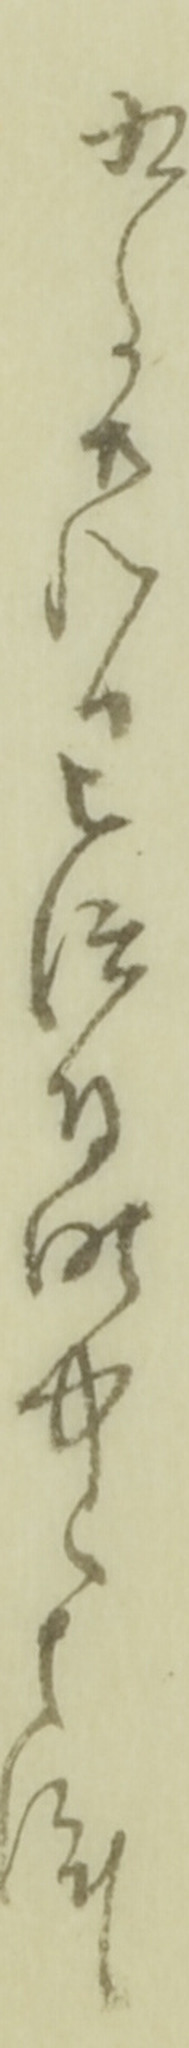九月廿八日被仰付町中へ申渡候
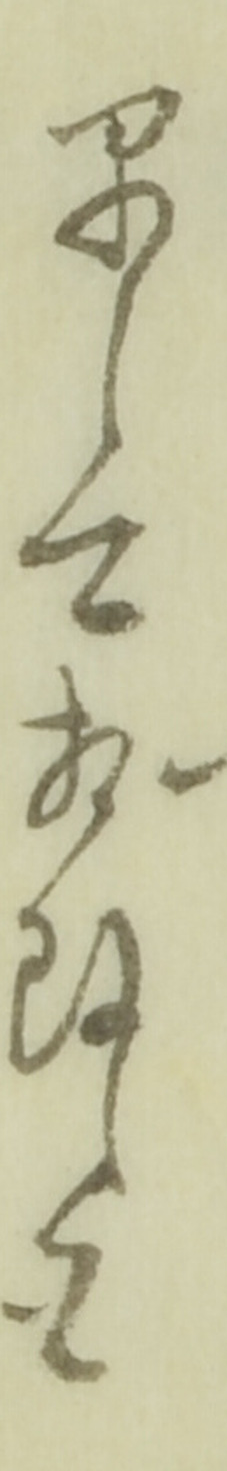早々可相改候以上
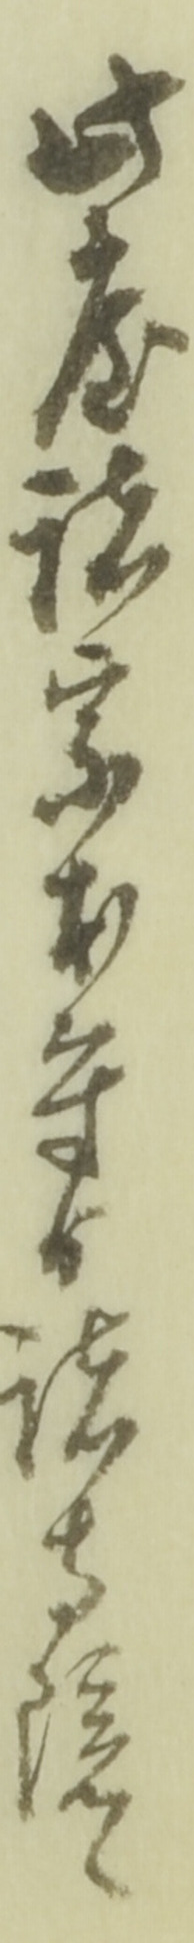此度諸宗本寺ゟ諸寺院へ
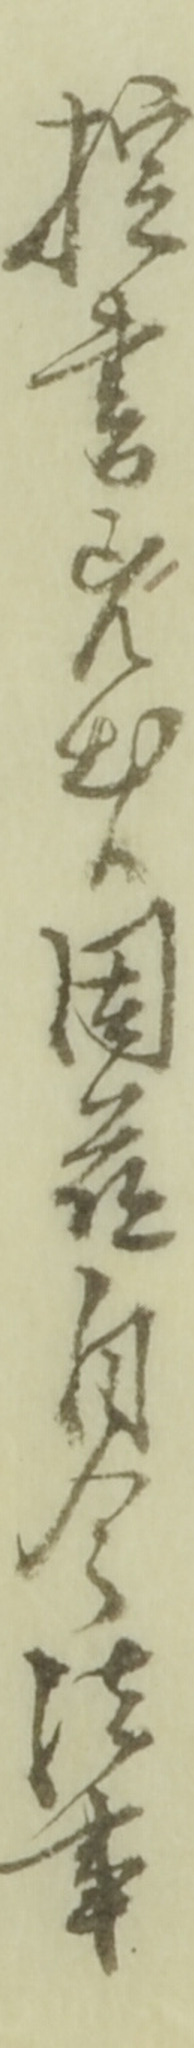掟書差出候因茲自今法事
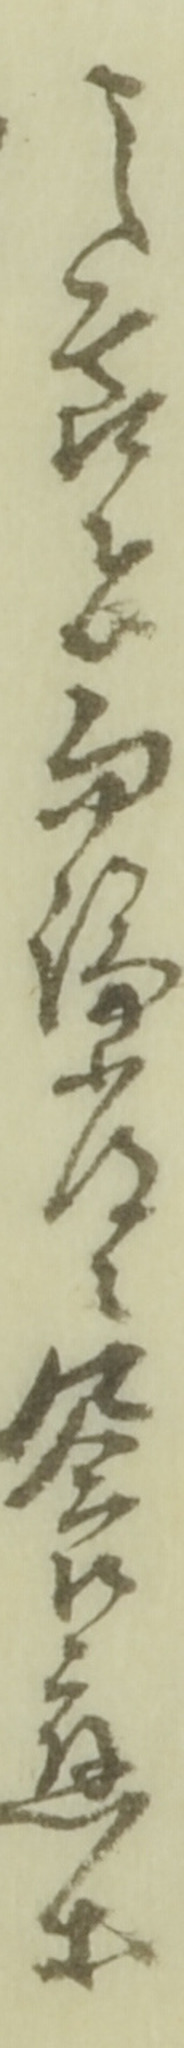之節者勿論常々饗応等
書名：御公儀様御領主様御触書控
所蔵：伊那市立高遠町図書館・合同会社AMANE
